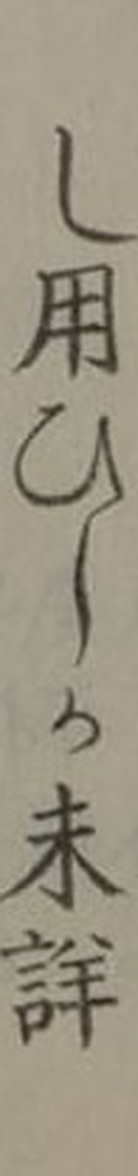し用ひしか未詳
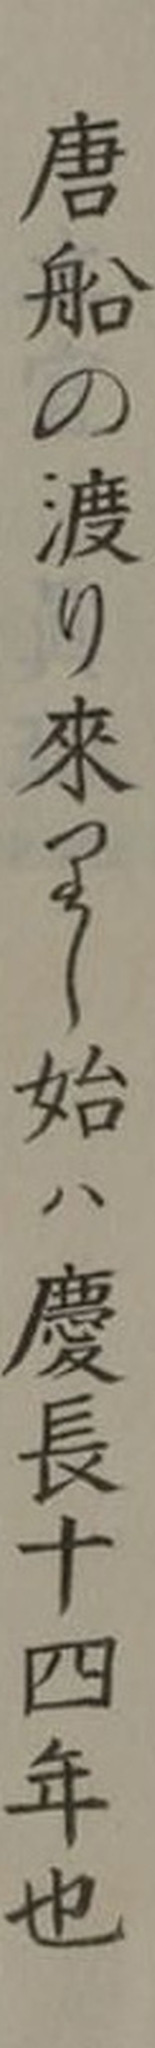唐船の渡り來りし始は慶長十四年也
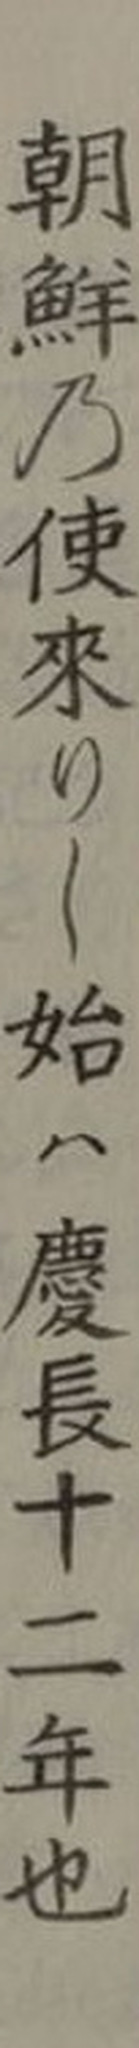朝鮮の使來りし始は慶長十二年也
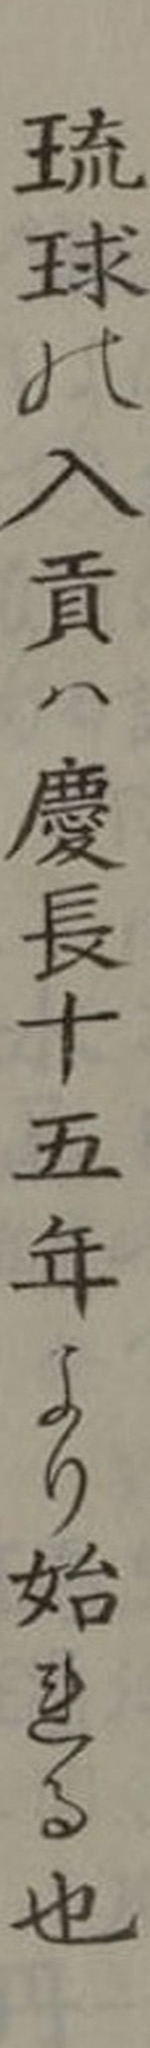琉球の入貢は慶長十五年より始れる也

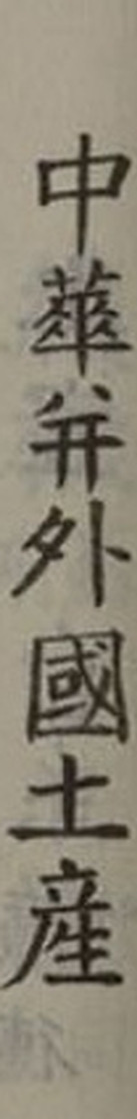中華并外國土産
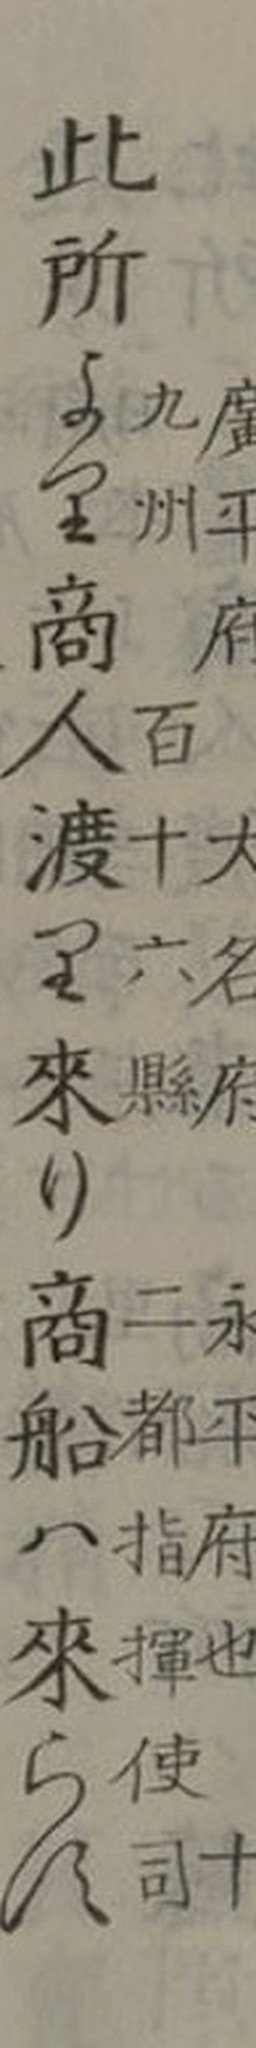此所より商人渡り來り商船は來らす

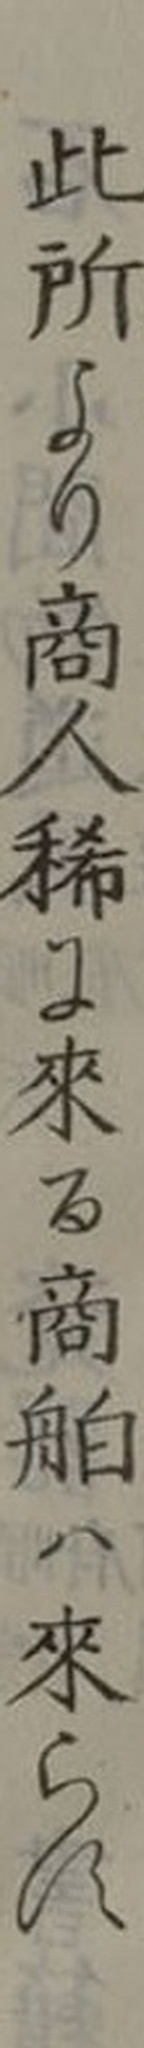此所より商人稀に來る商舶は來らす
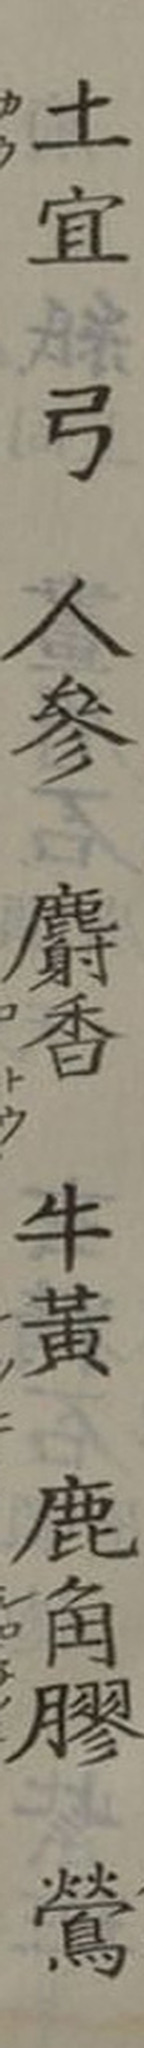土宜弓人參麝香牛黄鹿角膠鶯
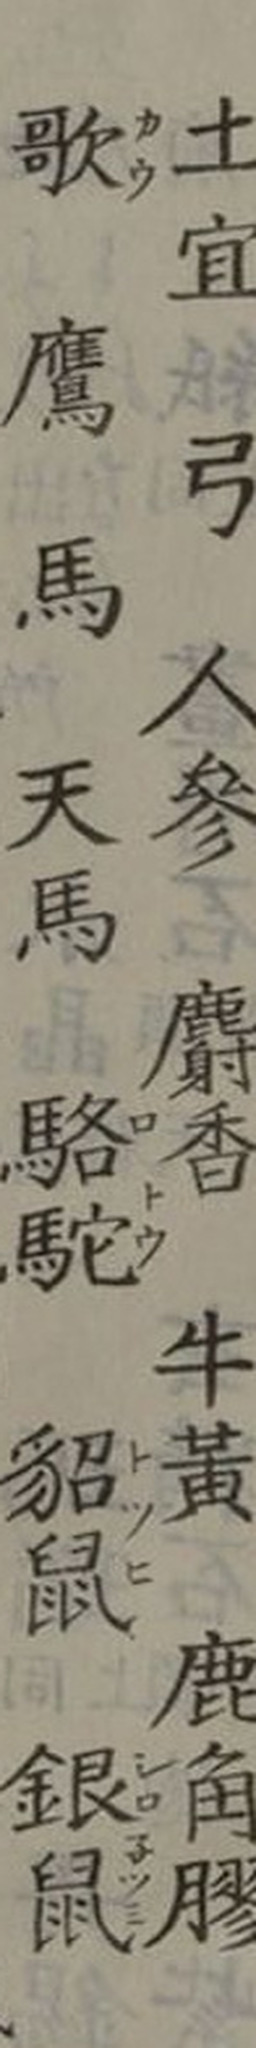歌鷹馬天馬駱駝貂鼠銀鼠
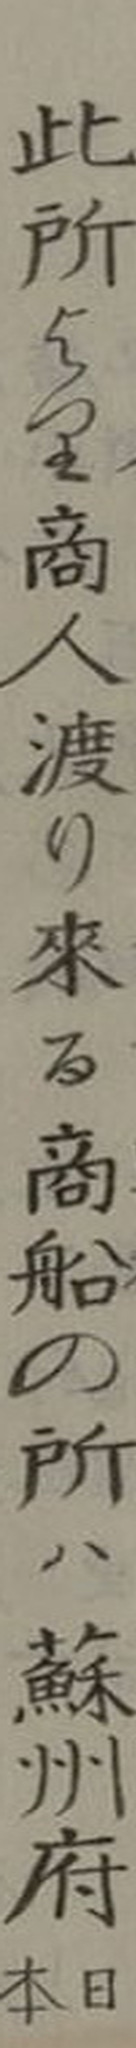此所より商人渡り來る商船の所は蘇州府日本

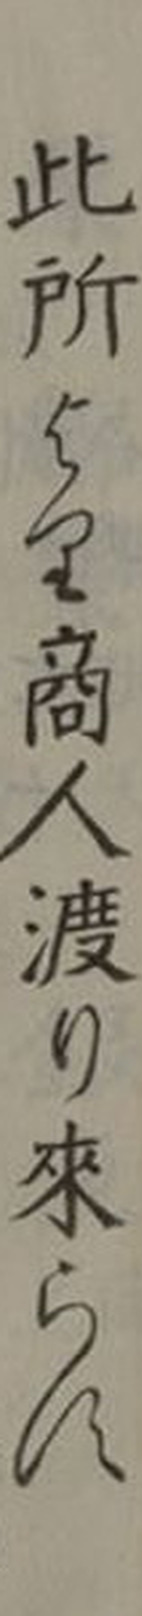此所より商人渡り來らす
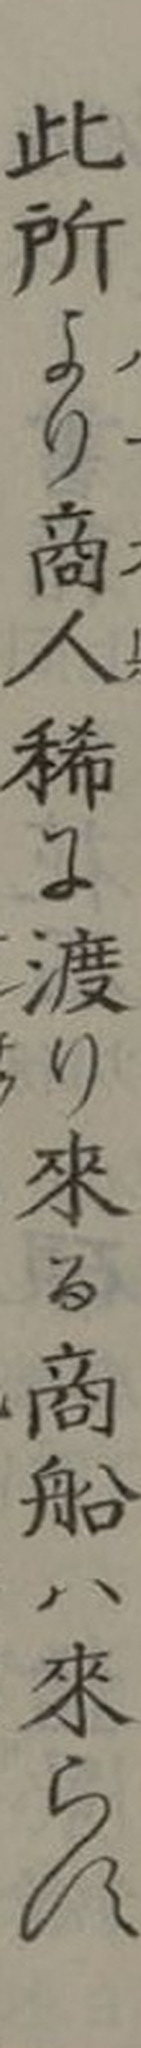此所より商人稀に渡り來る商船は來らす
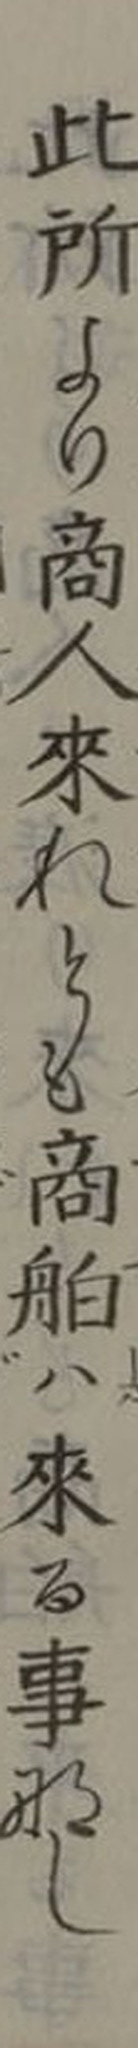此所より商人來れとも商舶は來る事なし

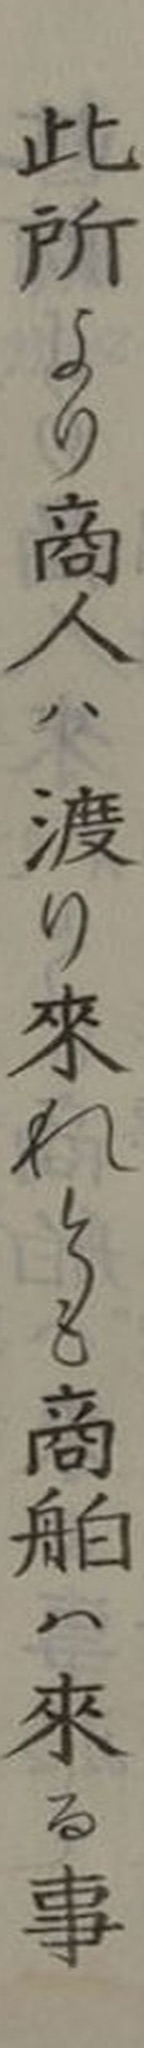此所より商人は渡り來れとも商舶は來る事

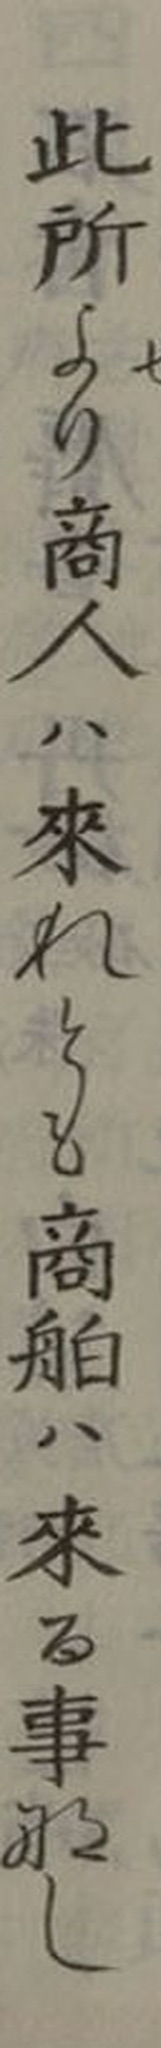此所より商人は來れとも商舶は來る事なし

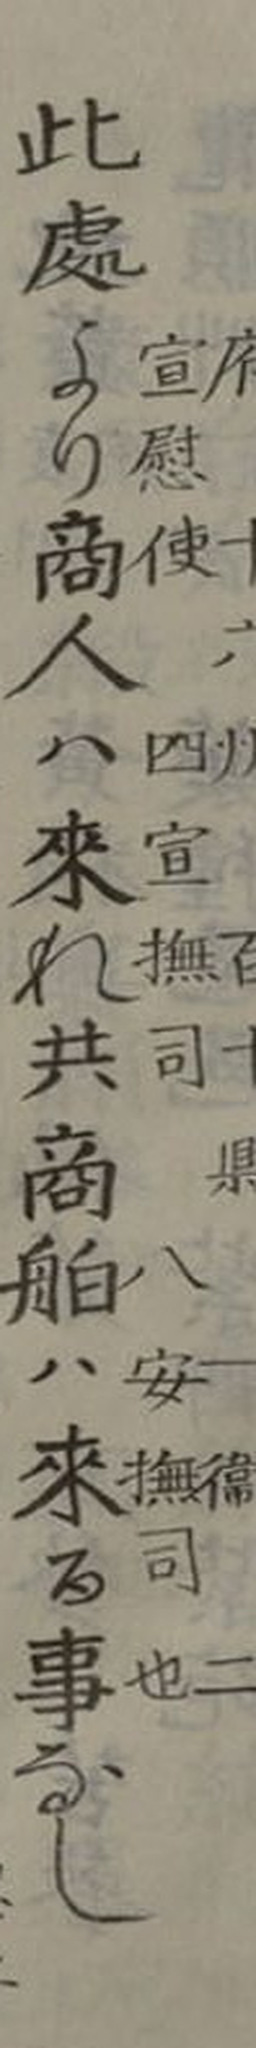此所より商人は來れ共商舶は來る事なし
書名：骨董録
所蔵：University of the Ryukyus Library
